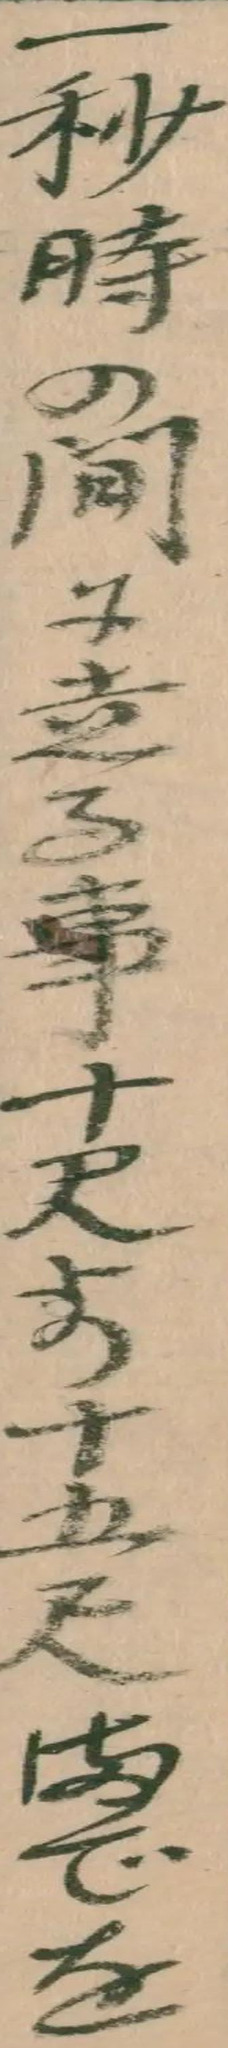一秒時の間に走る事十尺より十五尺までを
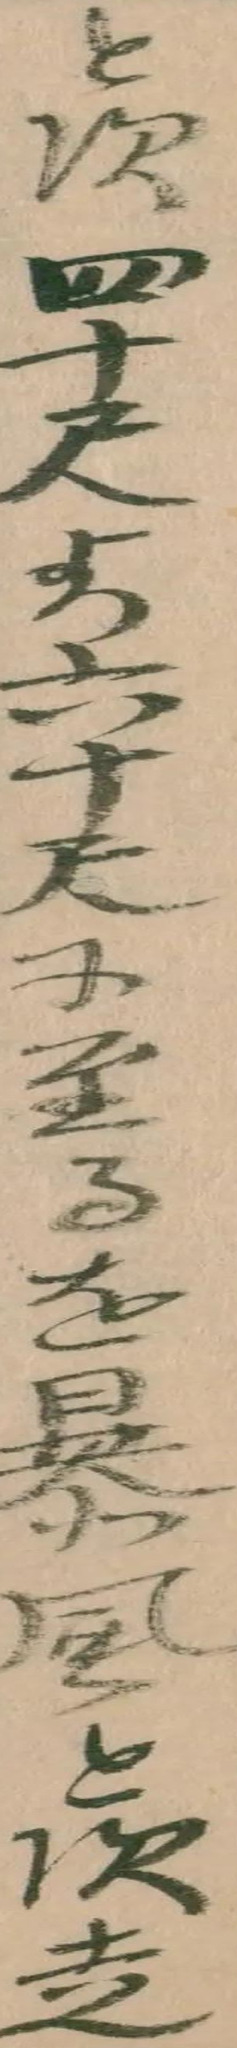とす四十尺より六十尺に至るを暴風とす走
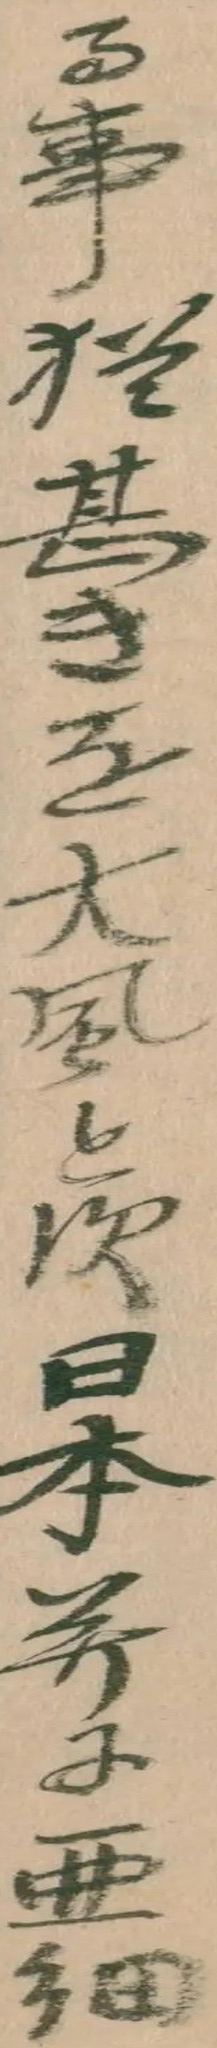る事猶甚きを大風とす日本并に亜細
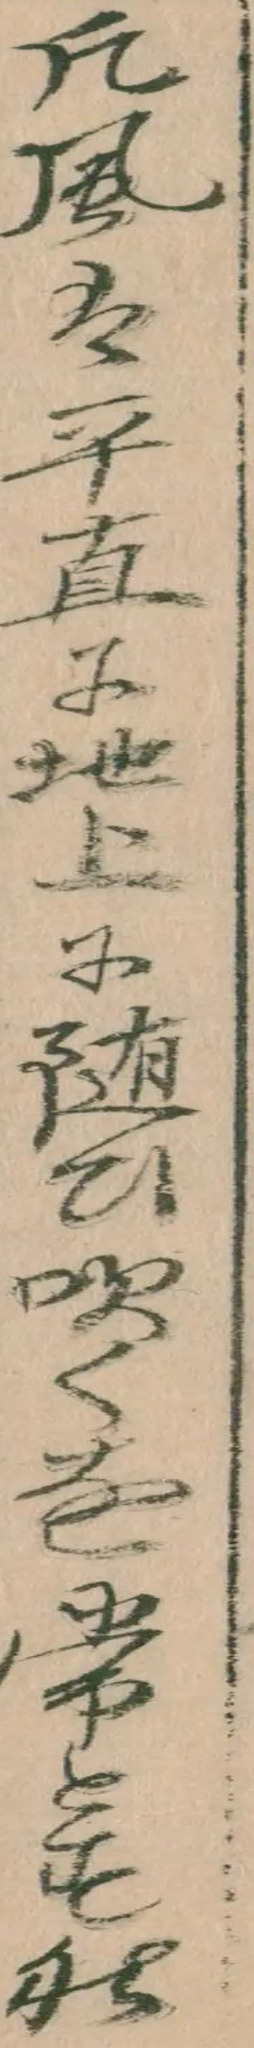凡風は平直に地上に随ひ吹くを常とす然
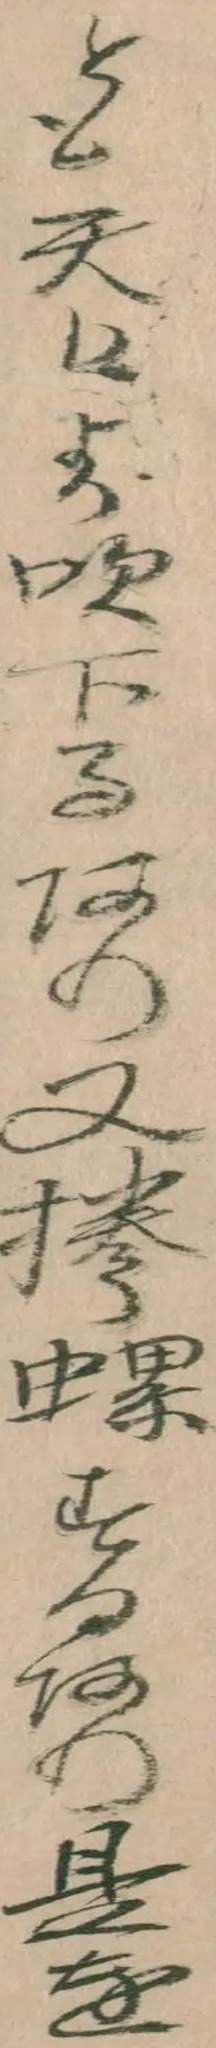とも天上より吹下るあり又捲螺するあり是を
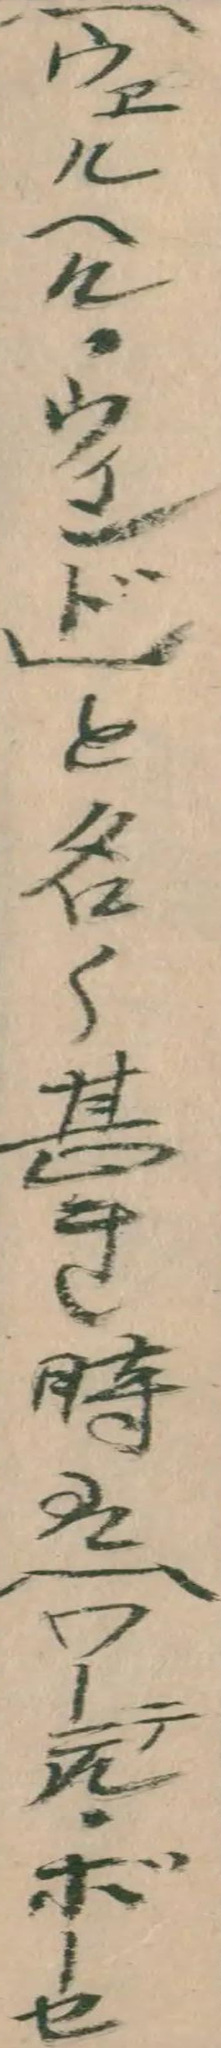(ウヱルヘル・ウィンド)と名く甚き時は(ワーテル・ボーセ

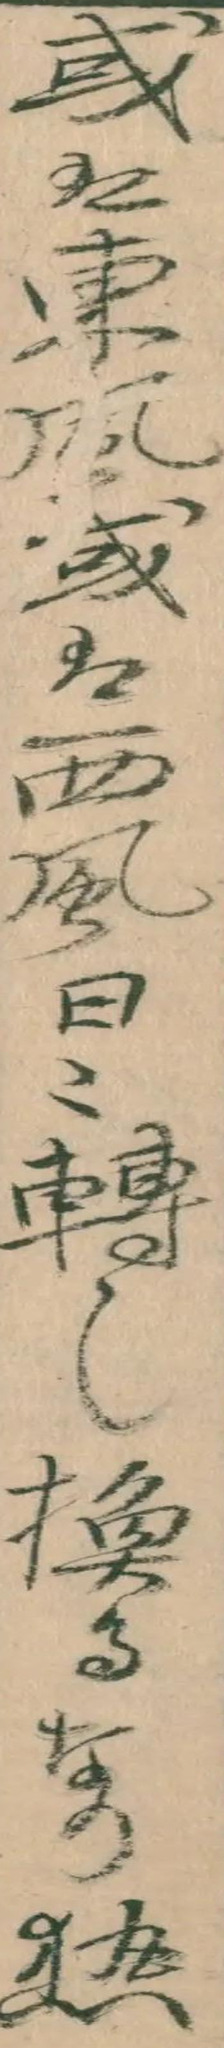或は東風或は西風日々転し換るなり熱
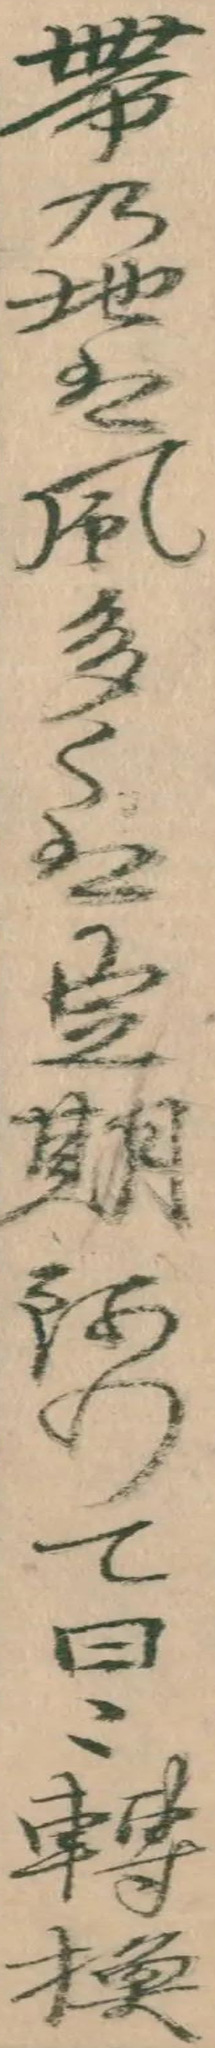帯の地は風多くは定期ありて日々転換
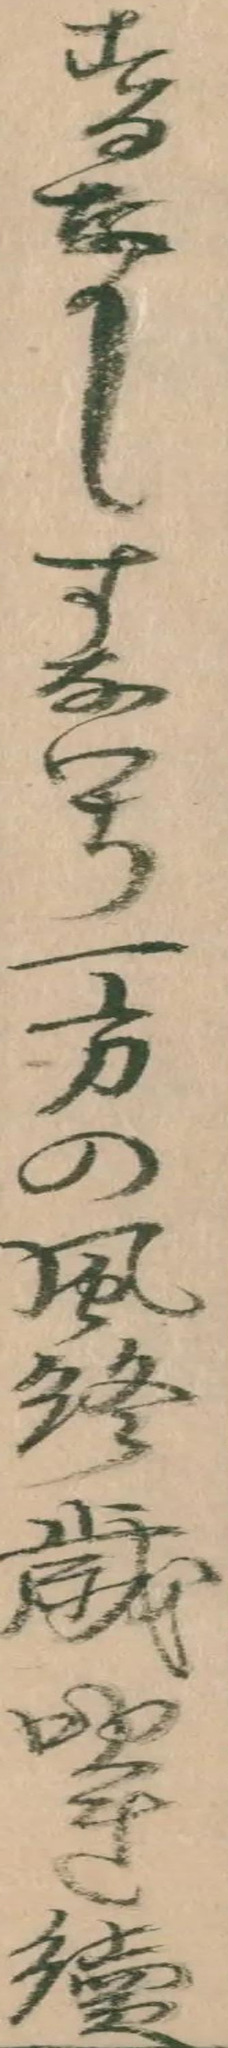するなしすなり一方の風終歳吹き続
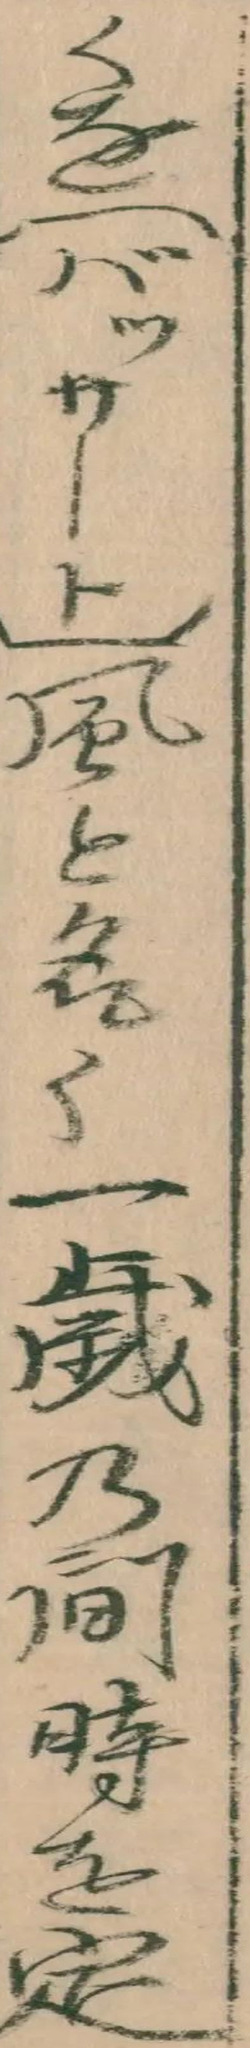くを(バッサート)風と名く一歳の間時を定
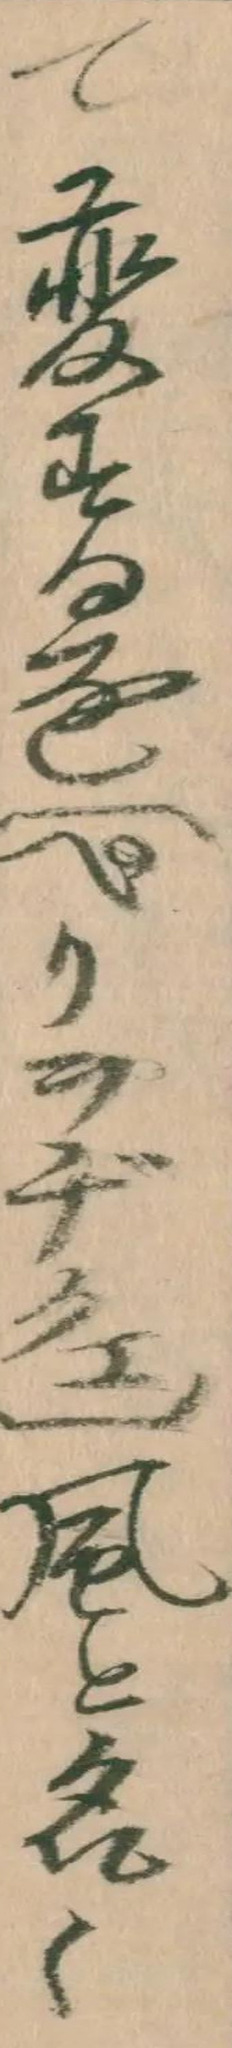て変するを(ペリヲヂクェ)風と名く
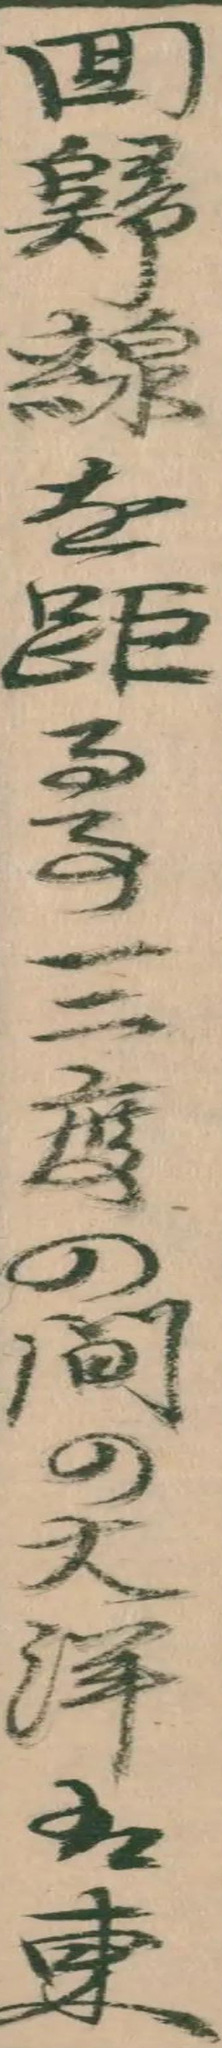回帰線を距る事一二度の間の大洋は東
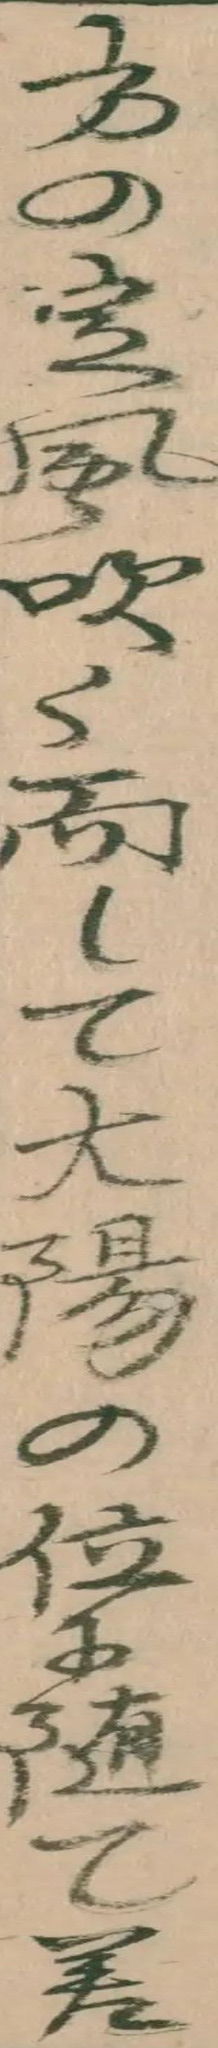方の定風吹く而して大陽の位に随て差
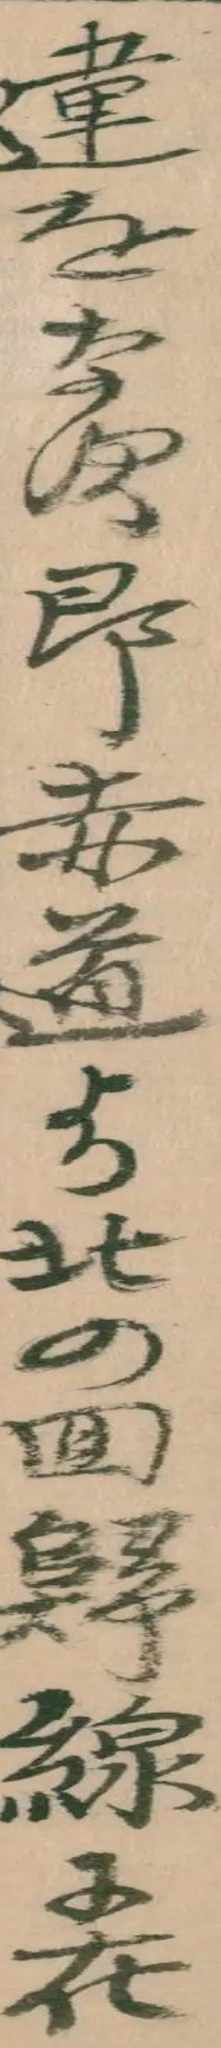違をなす即赤道より北の回帰線に在
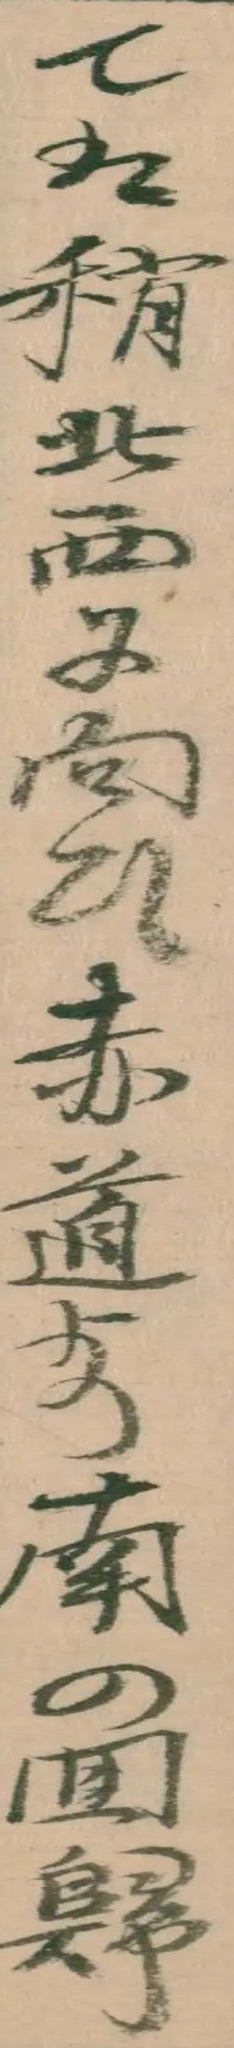ては稍北西に向ひ赤道より南の回帰
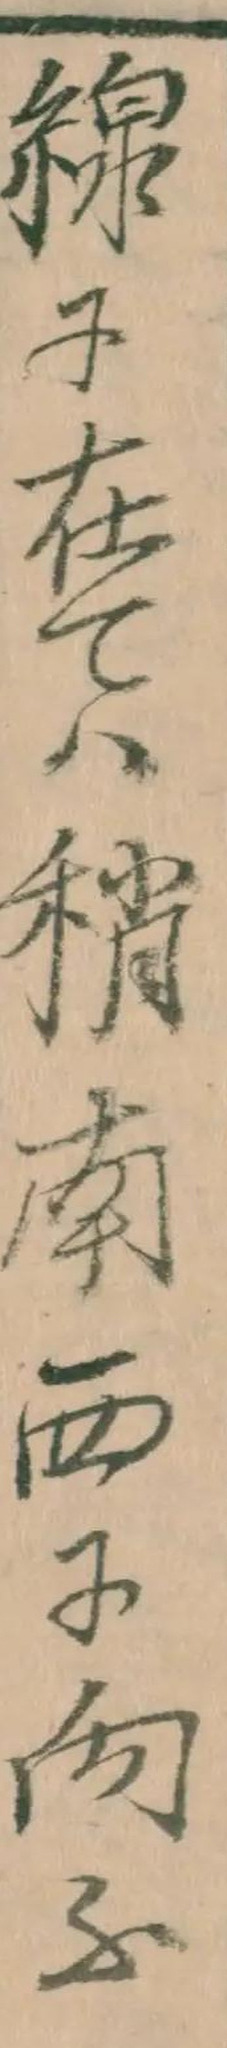線に在ては稍南西に向ふ
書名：新釈輿地図説
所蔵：国立国会図書館 National Diet Library, JAPAN
